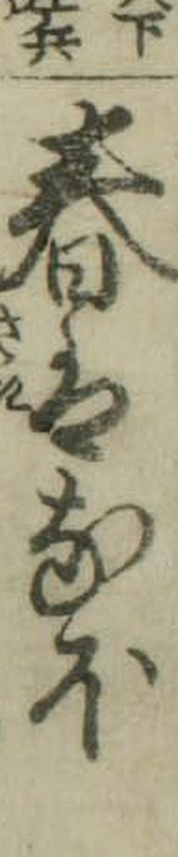春はなを
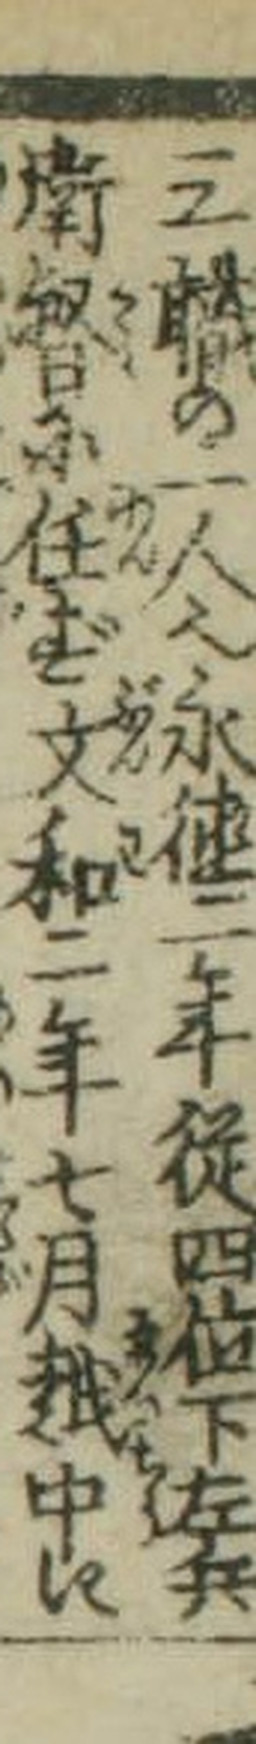衛督に任ず文和二年七月越中に
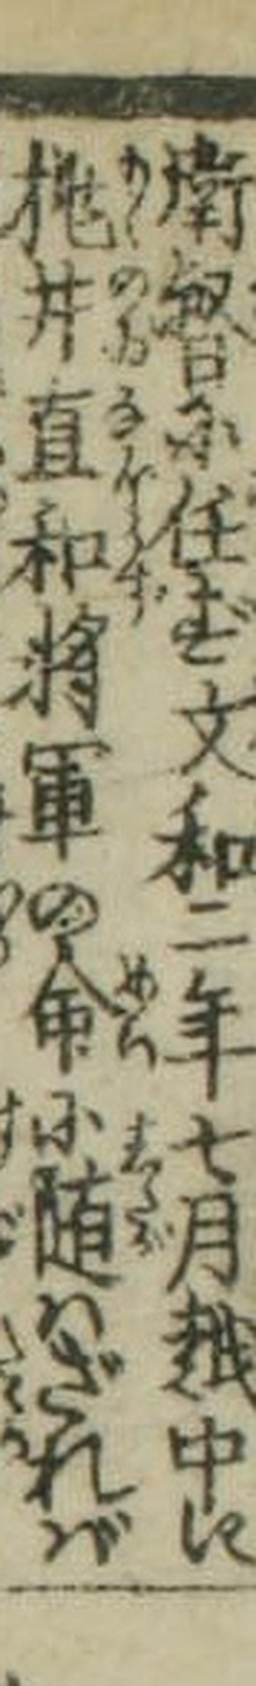桃井直和将軍の命に随はざれば
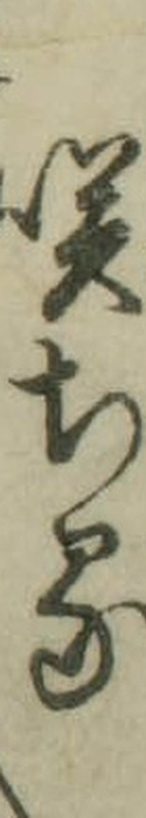咲ちる
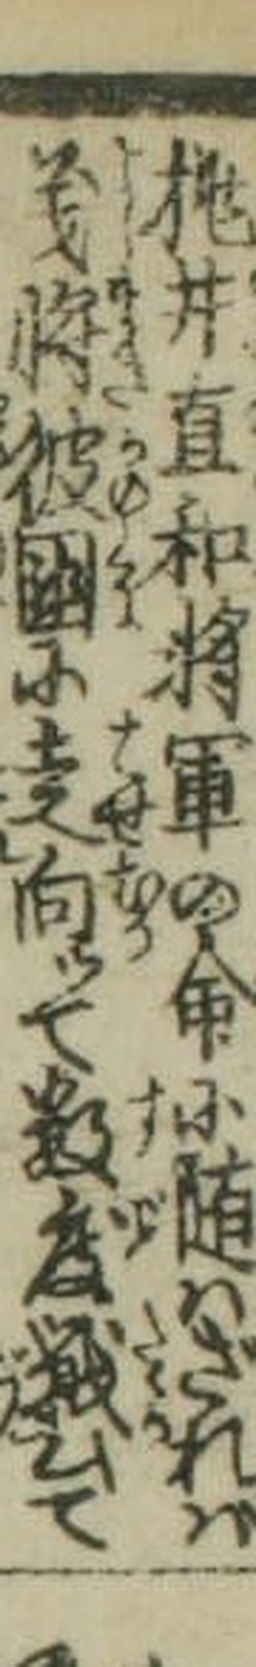義将彼國に走向ッて数度戦ひて
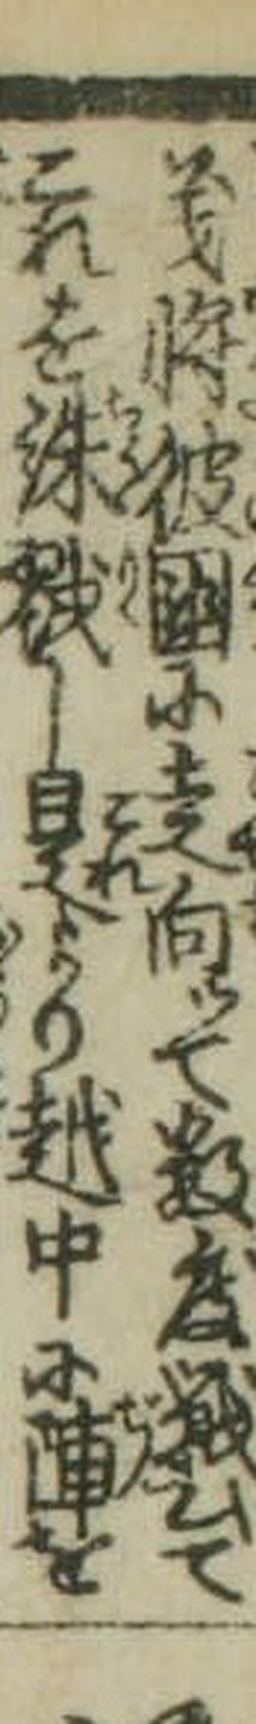これを誅戮し是より越中に陣を
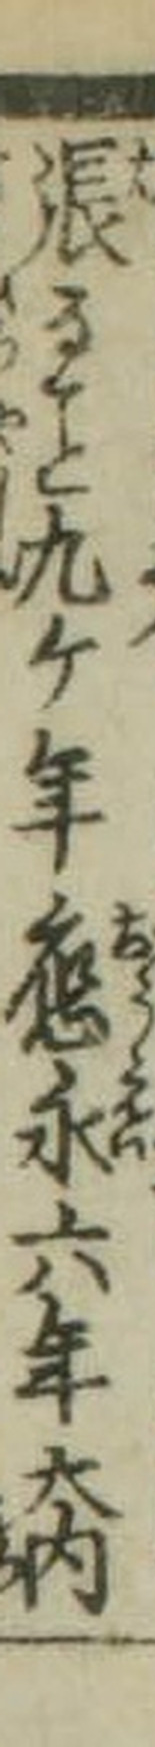張ること九ヶ年應永六年大内
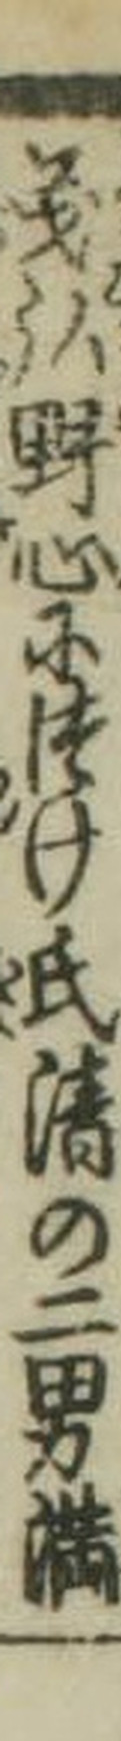義弘野心につけ氏清の二男満
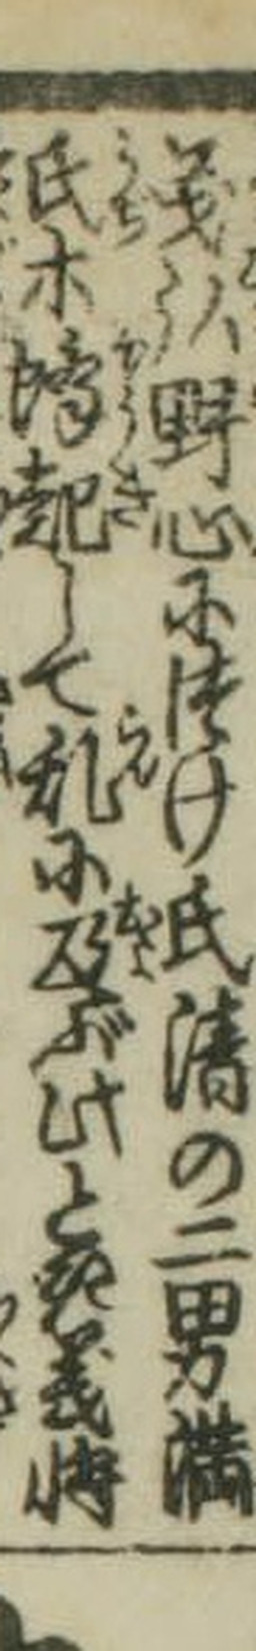氏等蜂起して乱に及ぶ此とき義将
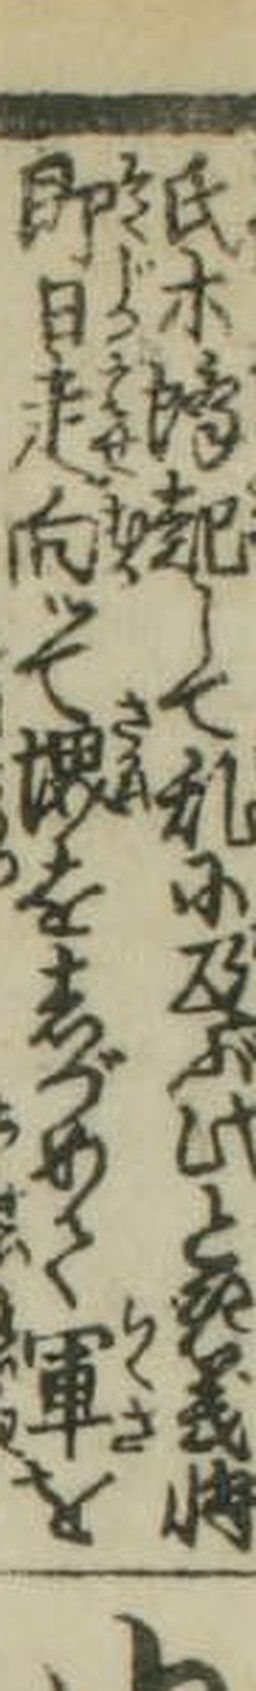即日走向ッて堺をしづめて軍を
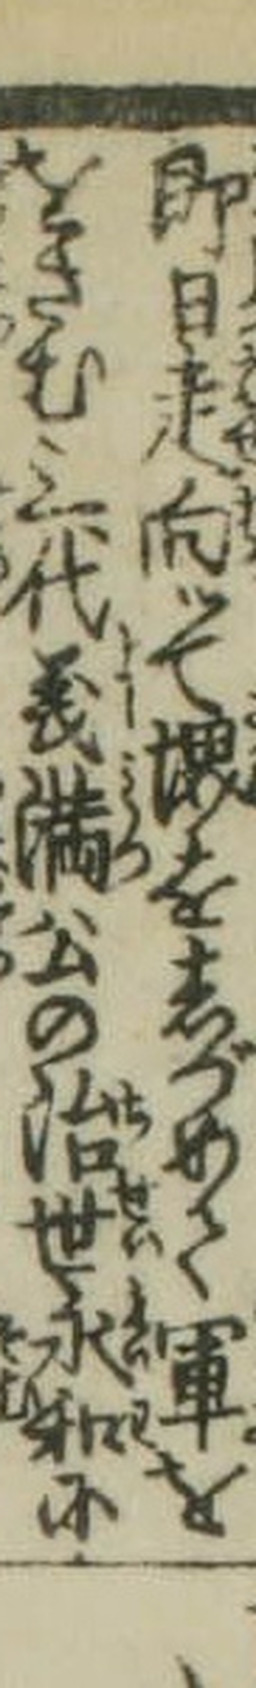をさむ三代義満公の治世永和に
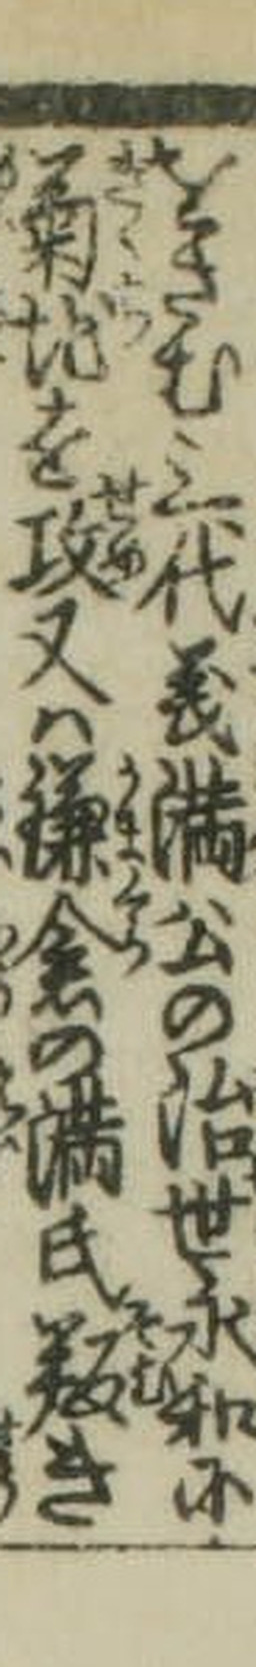菊地を攻又は鎌倉の満氏叛き
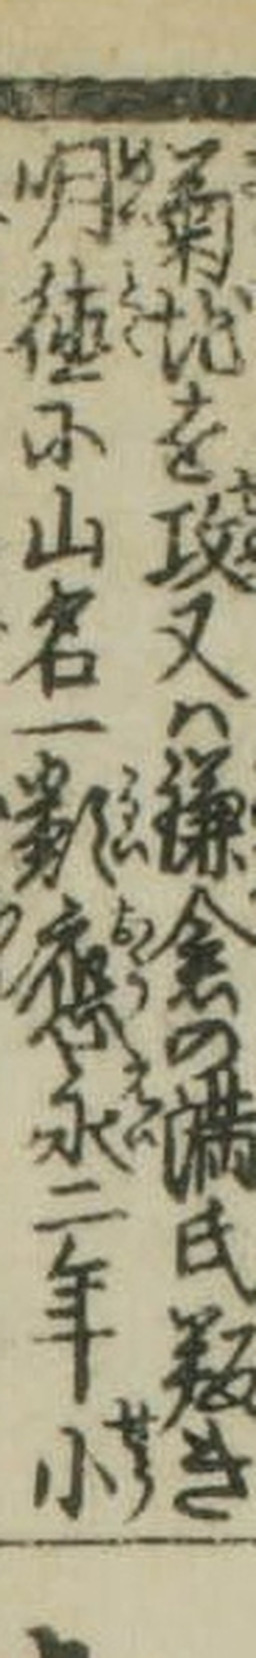明徳に山名一類應永二年小
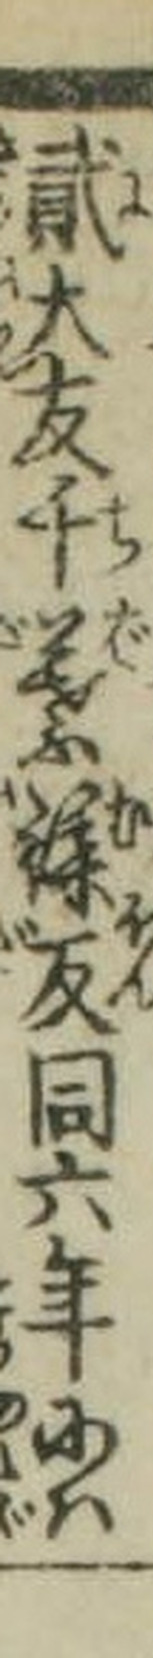貮大友千葉謀反同六年には
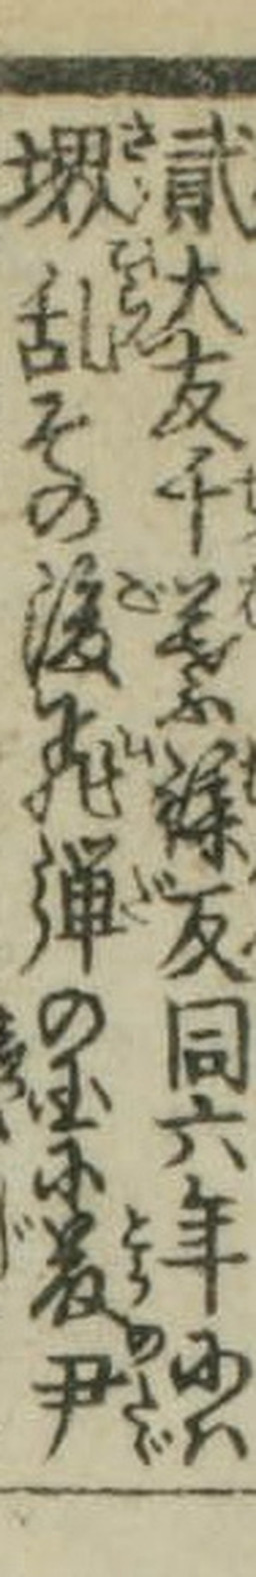堺乱その後飛騨の国に藤尹
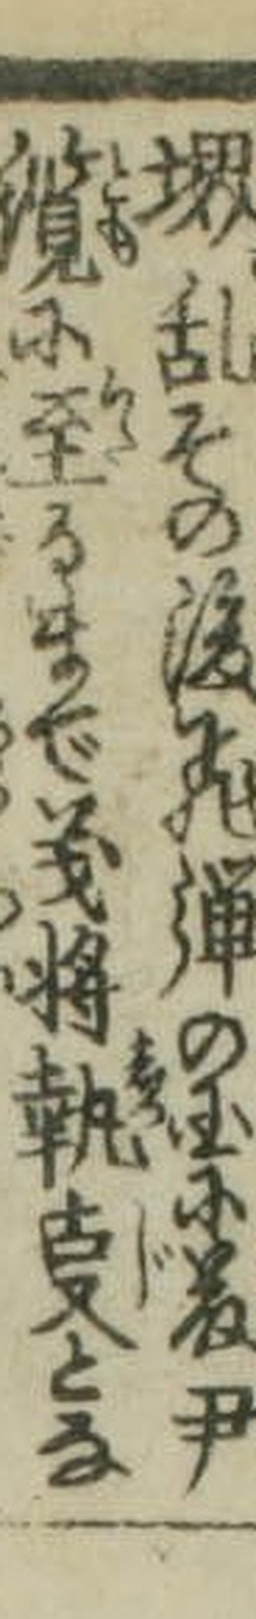䌫に至るまで義将執事とな
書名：續英雄百人一首
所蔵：東京学芸大学附属図書館
